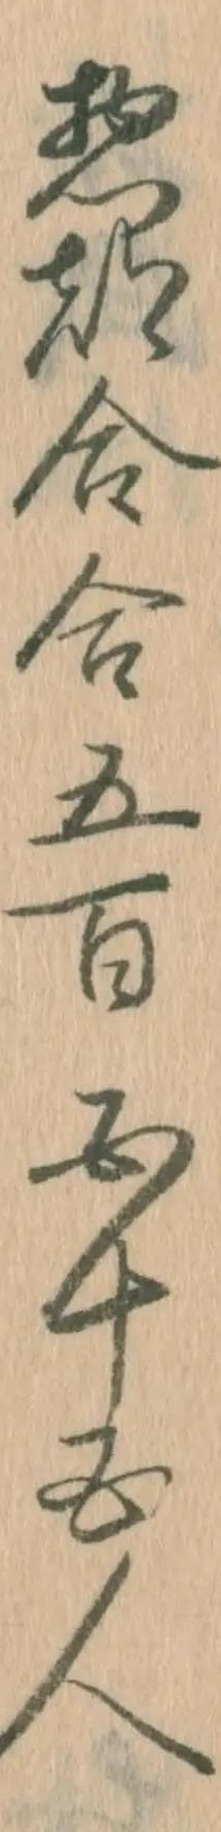惣都合合五百五十五人
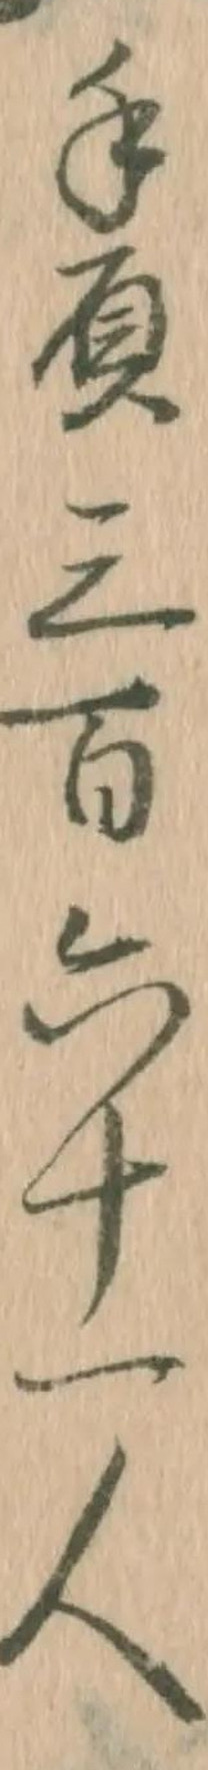内手負三百六十一人
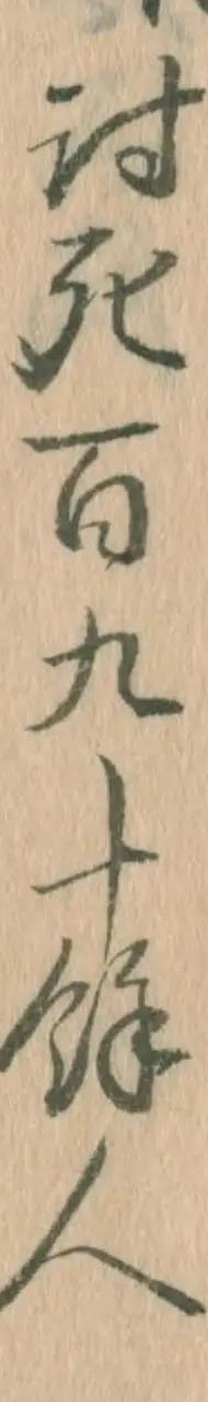討死百九十余人
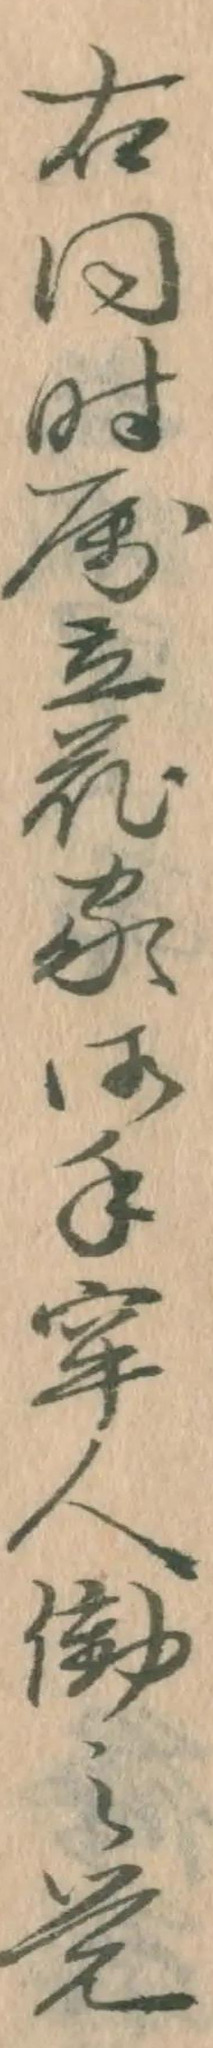右同時属立花家御手牢人働之覚

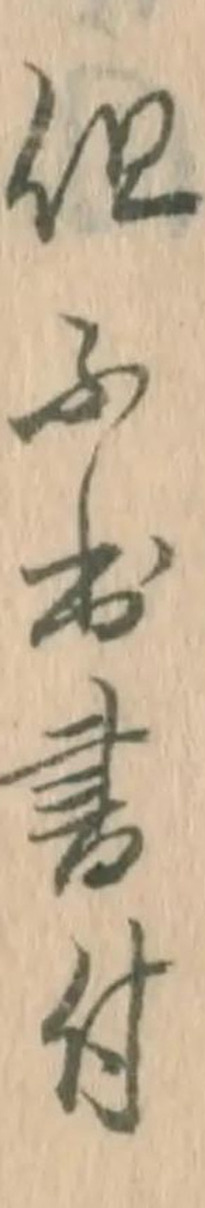組ふ出書付

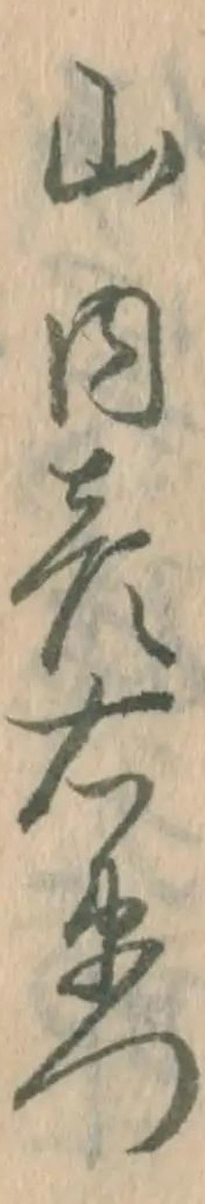山内彦右衛門

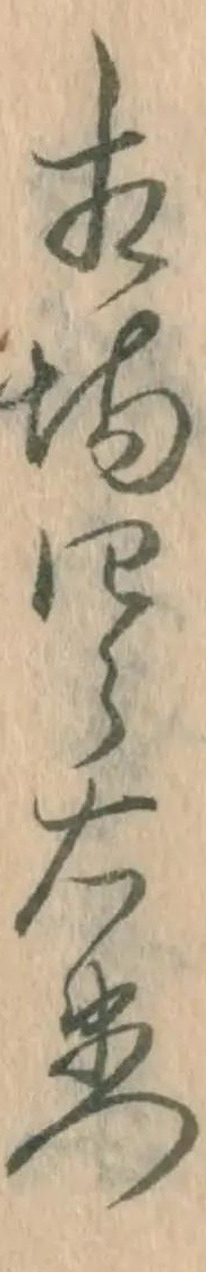相場四郎右衛門
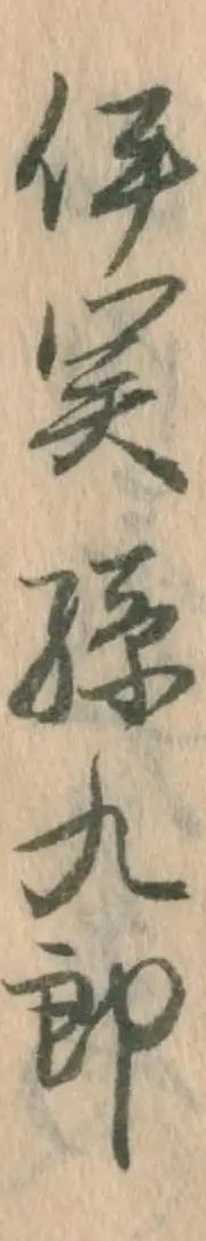伊関孫九郎
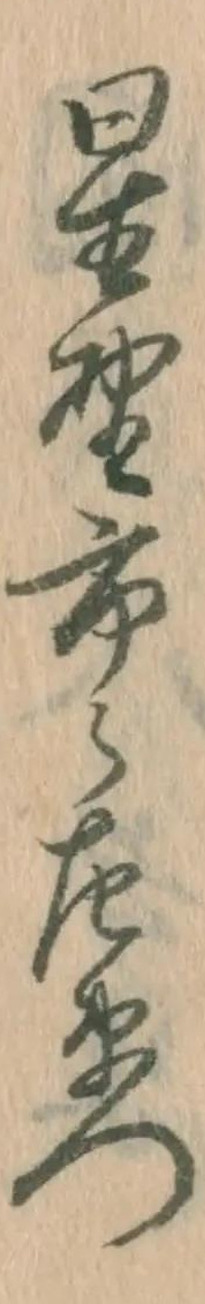星野市郎左衛門
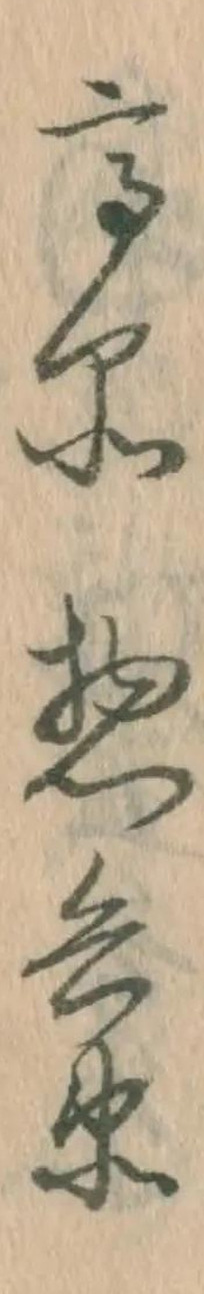高原惣兵衛
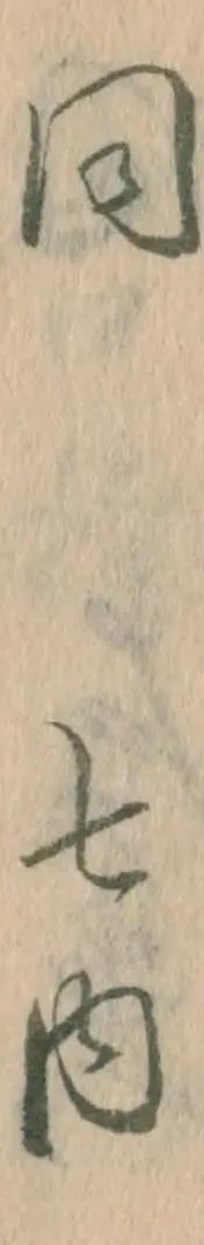同七内
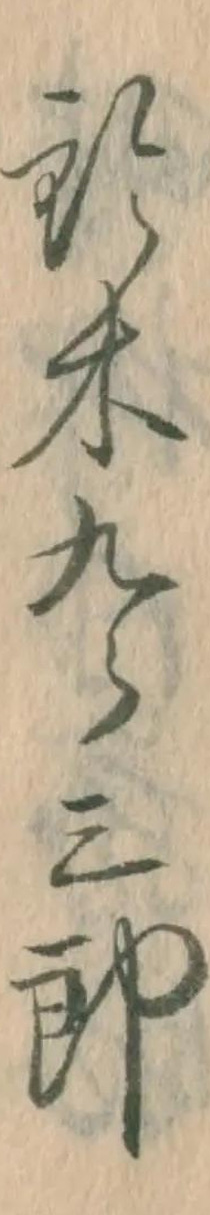鈴木九郎三郎
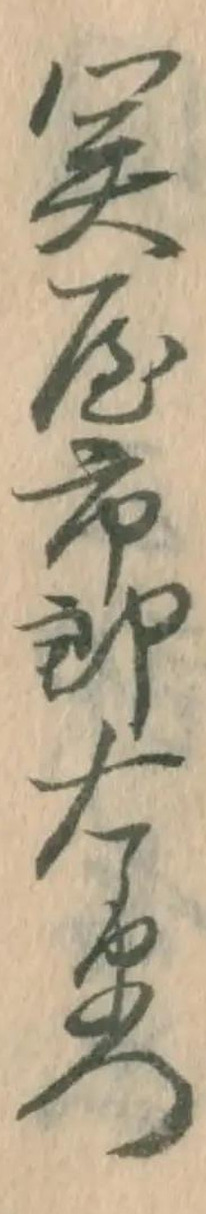関屋市郎右衛門

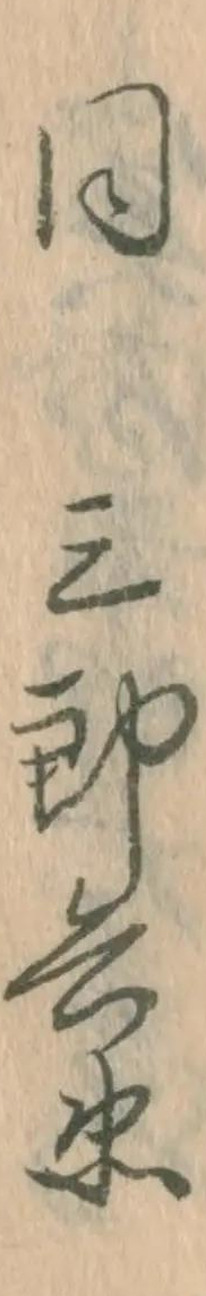同三郎兵衛
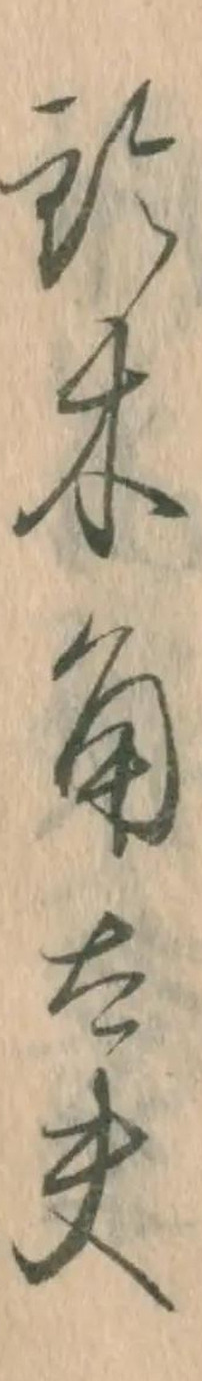鈴木角太夫
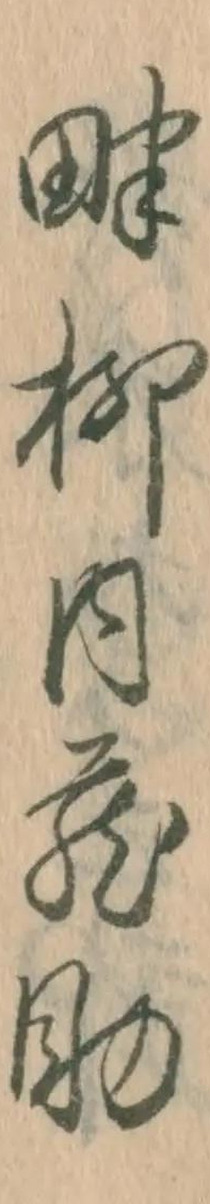畔柳内蔵助
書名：切支丹御退治記 49巻. [9]
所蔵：国立国会図書館 National Diet Library, JAPAN
